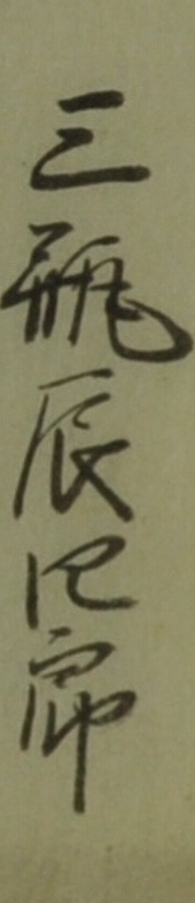三瓶辰四郎
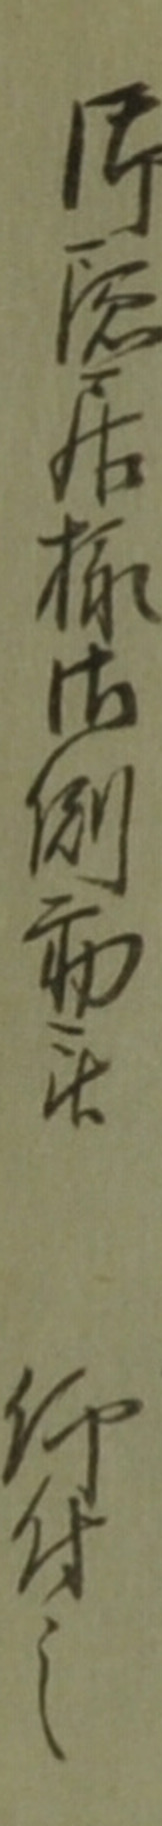御隠居様御側勤被仰付之
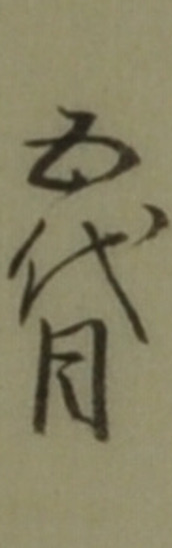五代目
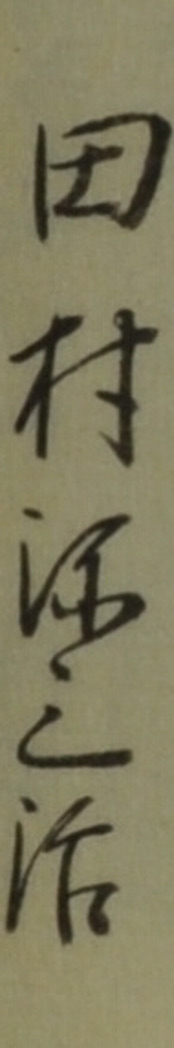田村源三治
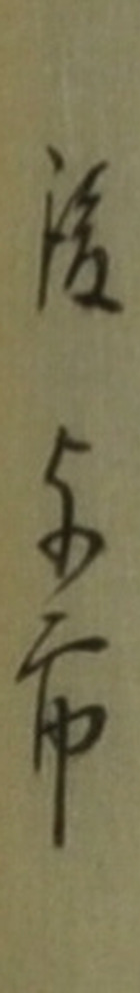後与市
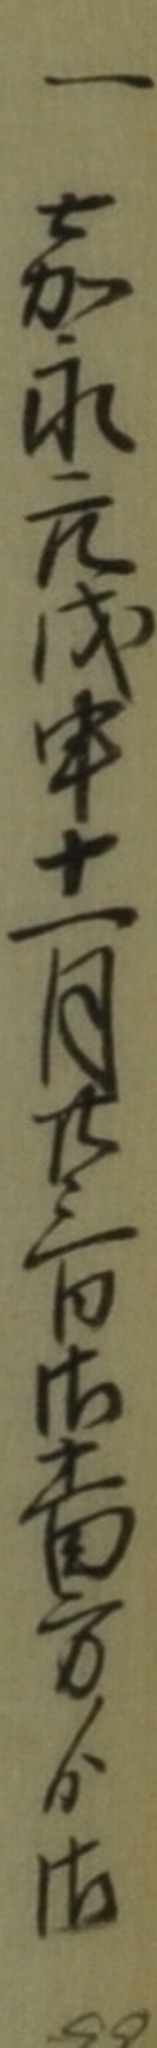一嘉永元戊申十一月廿三日御番方ゟ御
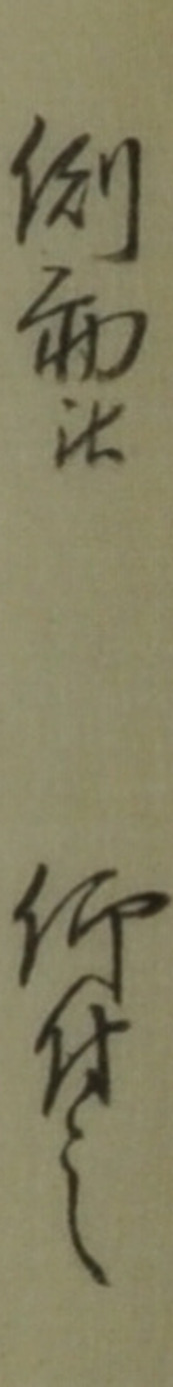側勤被仰付之
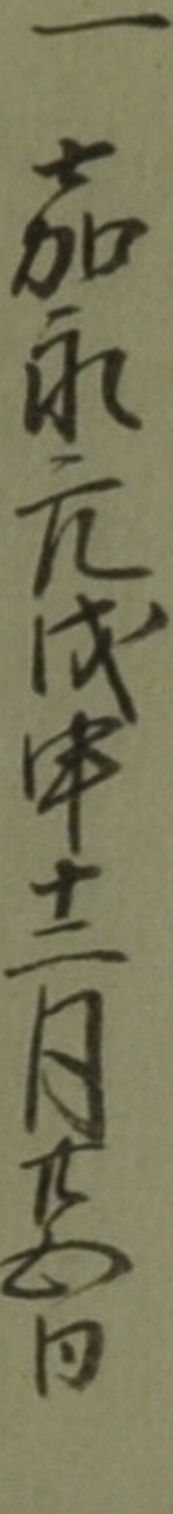一嘉永元戊申十二月廿五日
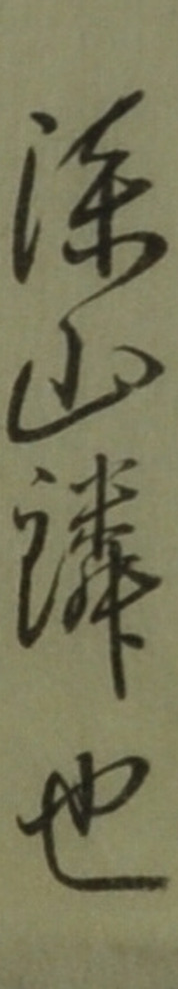漆山隣也
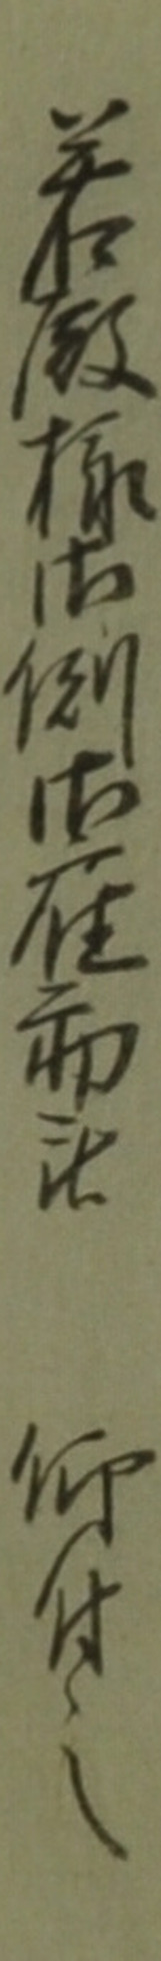若殿様御側御雇勤被仰付之

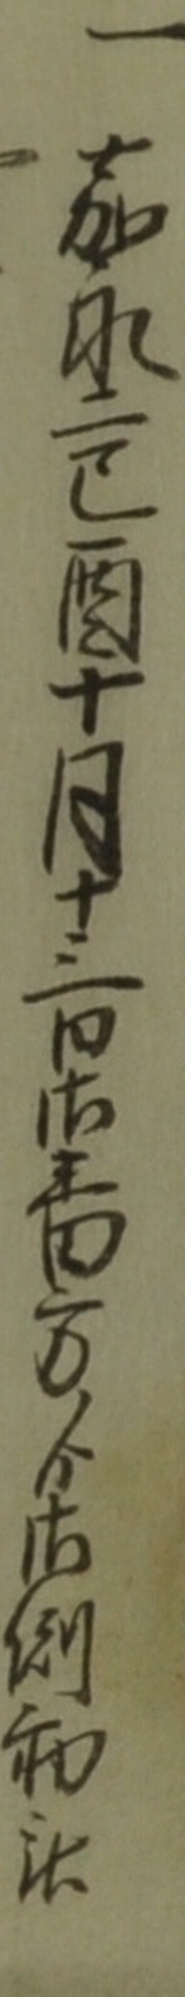一嘉永二己酉十月十三日御番方ゟ御側勤被
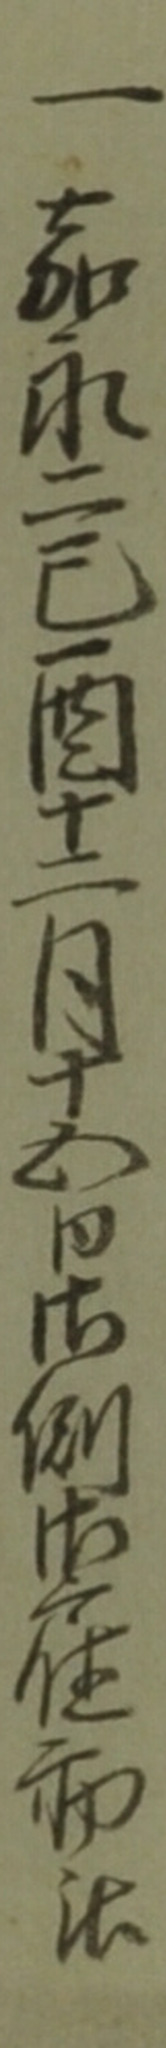一嘉永二己酉十二月十五日御側御雇勤被
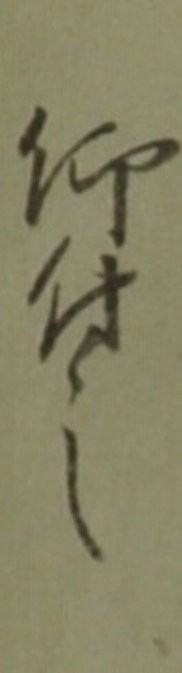仰付之
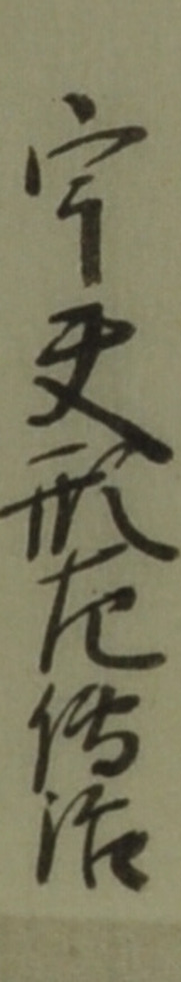宇夫形左伝治

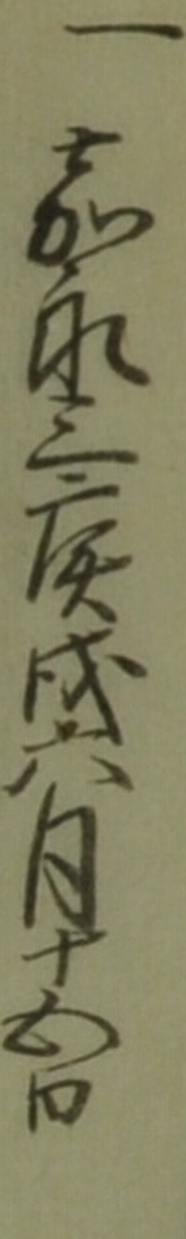一嘉永三庚戌六月十五日
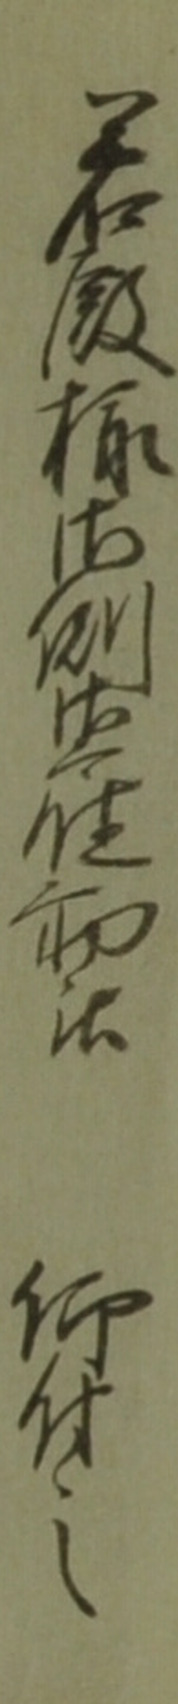若殿様御側御雇勤被仰付之
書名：諸御役代々録（五）
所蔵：伊那市立高遠町図書館・合同会社AMANE
